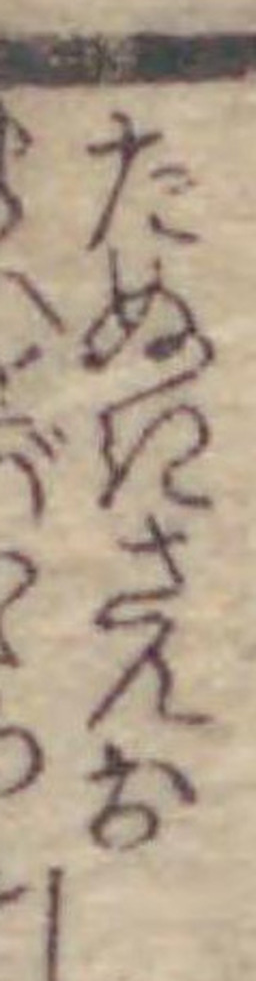たぬきさんお
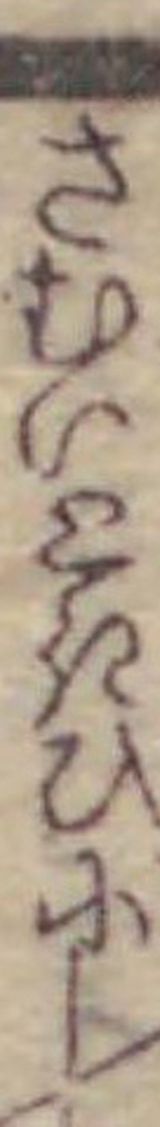さむいときひに
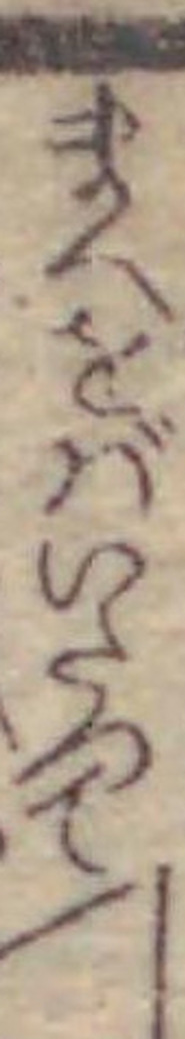まへをばいたつて
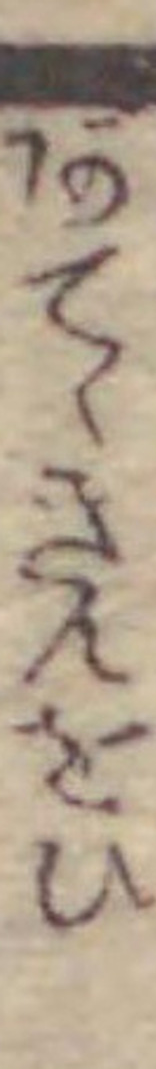あてゝきｎをひ
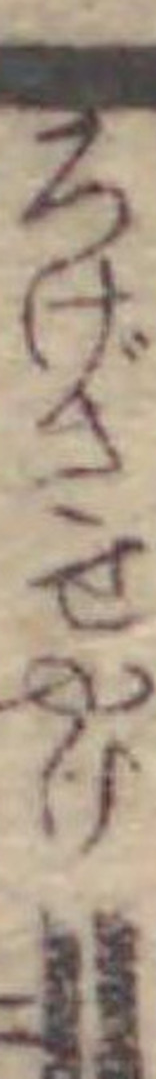ろげさせやけ
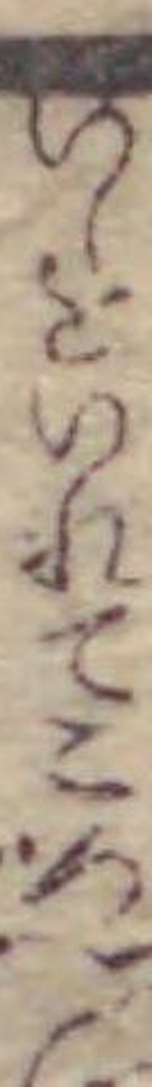いしをいれてころ
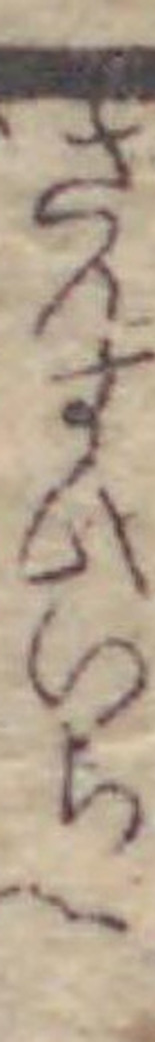さんす此いち
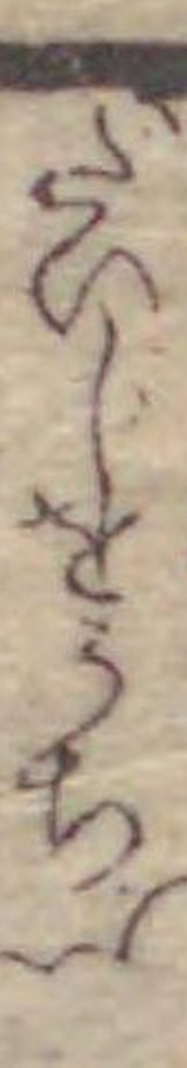だいじをうち
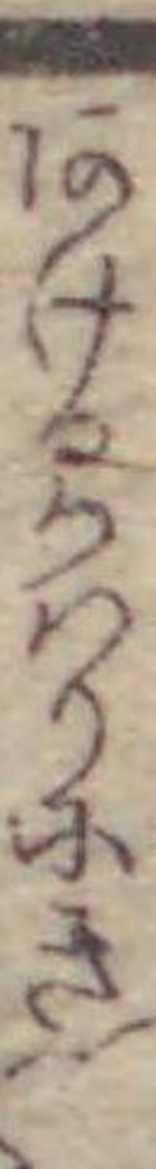あけるかはりにき
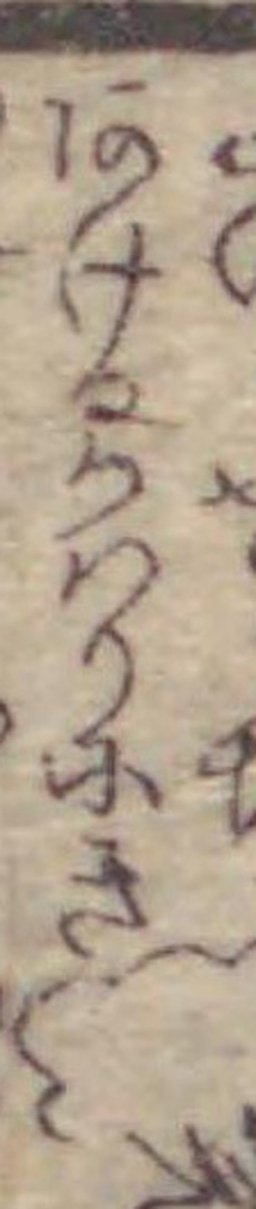あけるかはりにき
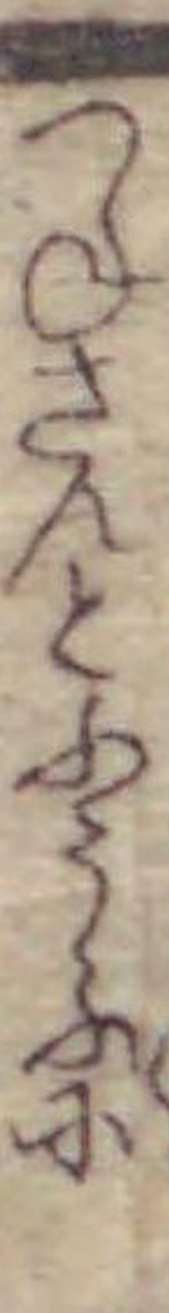つねさんとふうふに
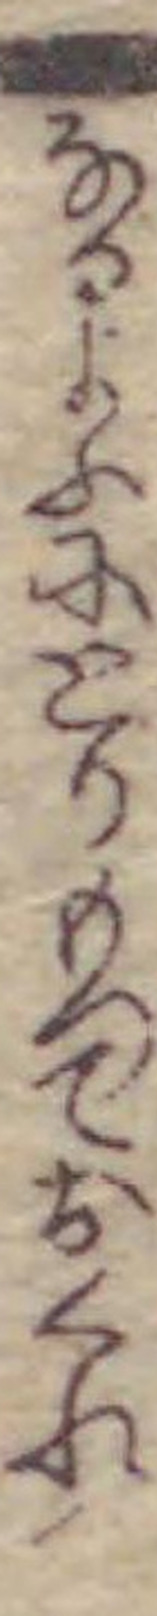なるよふにとりもつておくれ
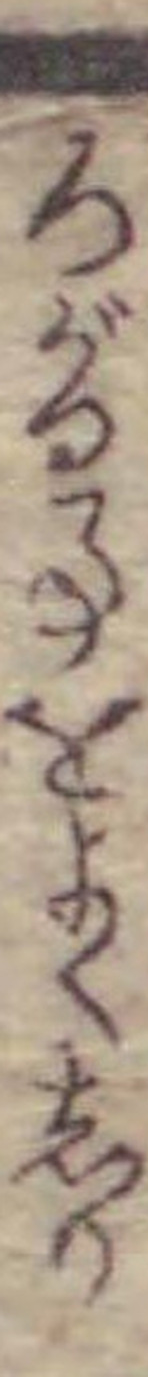ろがる事をよくしり
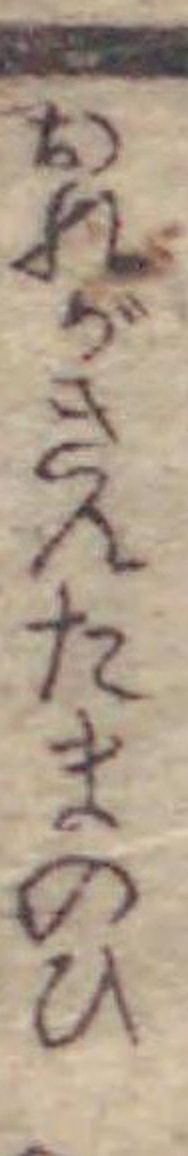おれがきんたまのひ
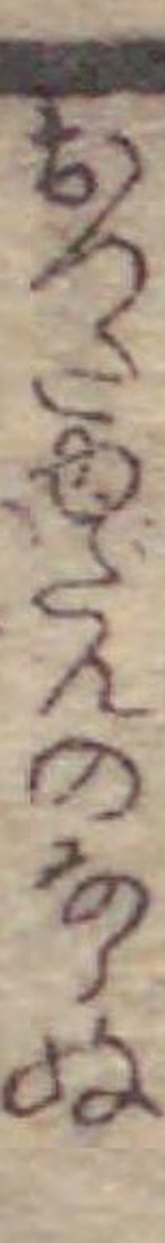おつたゆたんのならぬ
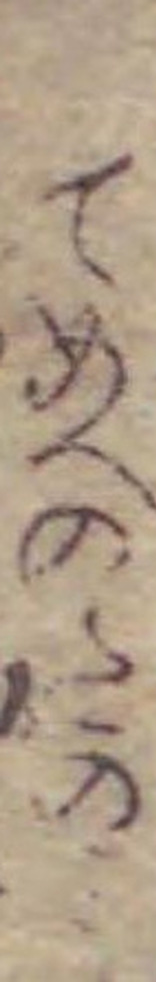てめへのたの
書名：化物仲間破 : 2巻
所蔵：国立国会図書館 National Diet Library, JAPAN
